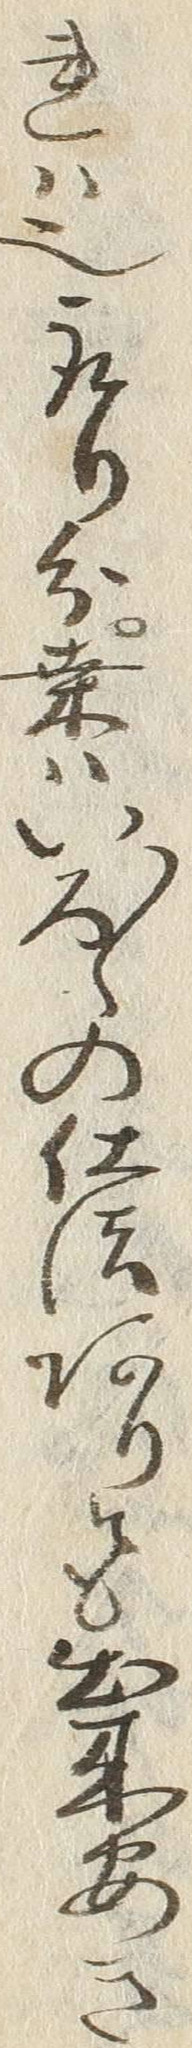連は也取り分。桑はいろ〳〵の仕法阿りとも出来安き
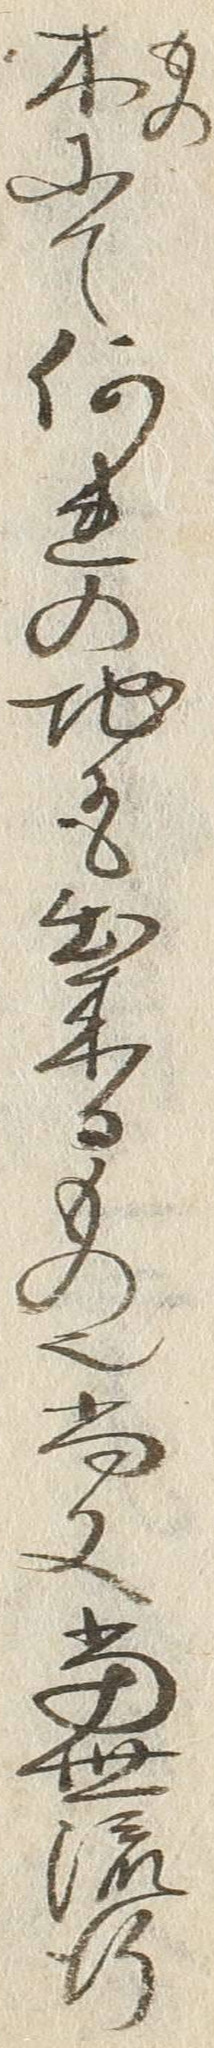木尓て何連の地尓も出来るもの也尚又当世流行
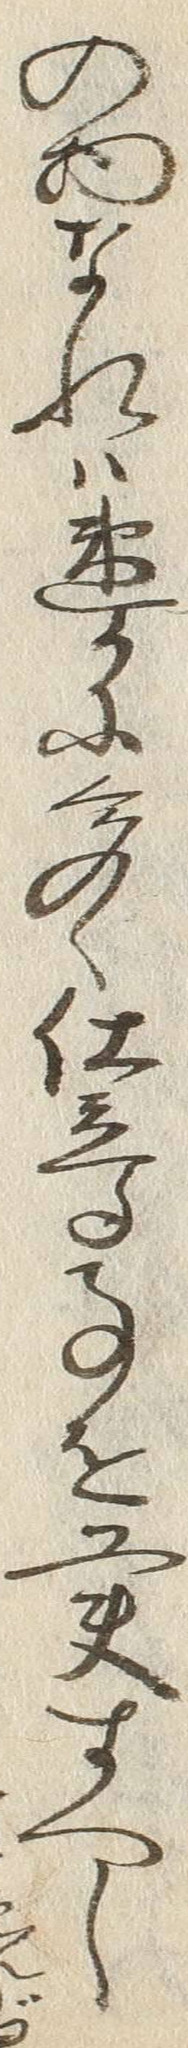の物なれは速か尓多く仕立る事を工夫すへし
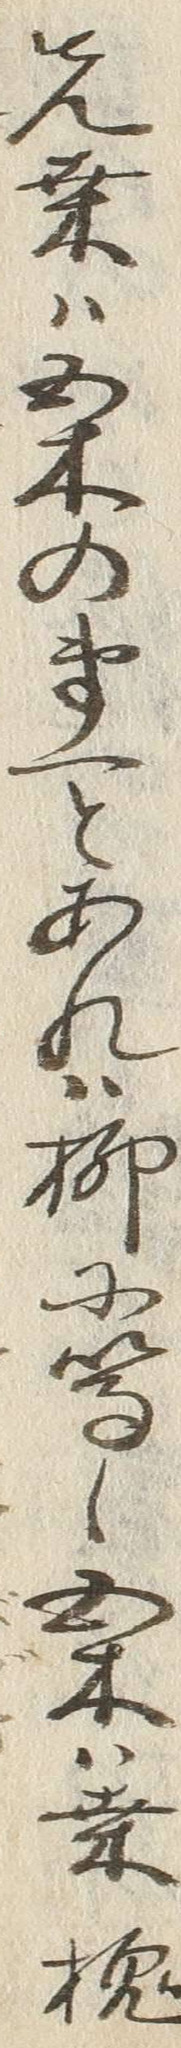先桑五木の第一とあれは柳尓等し五木は桑槐
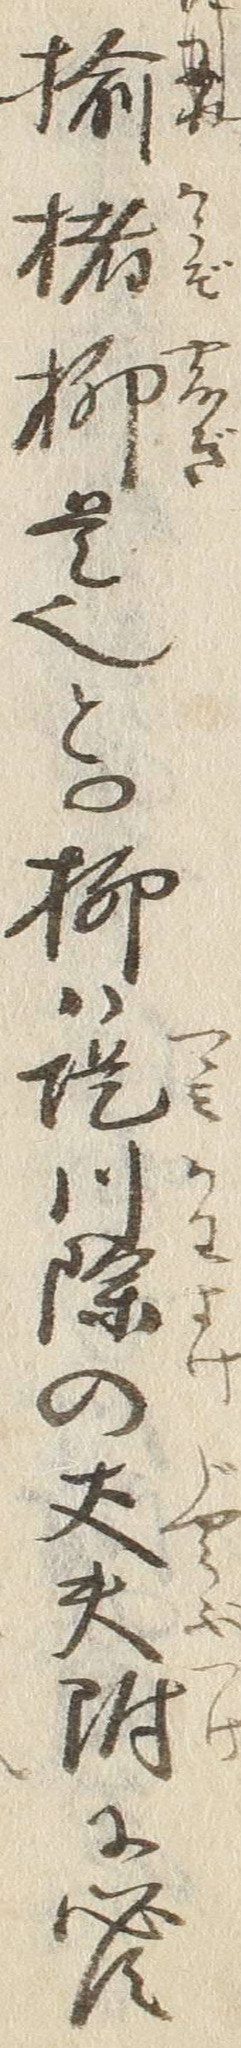楡楮柳是也と。柳は堤川除の丈夫附尓必須
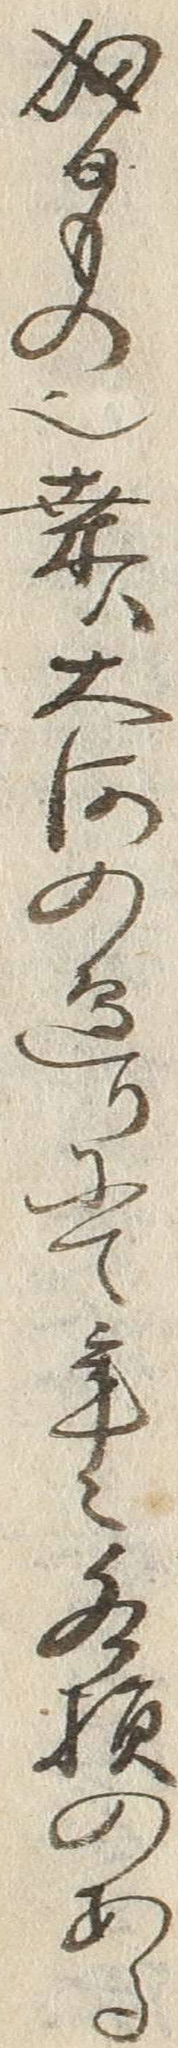成るもの也桑は大河の邊り尓て年々水損のある
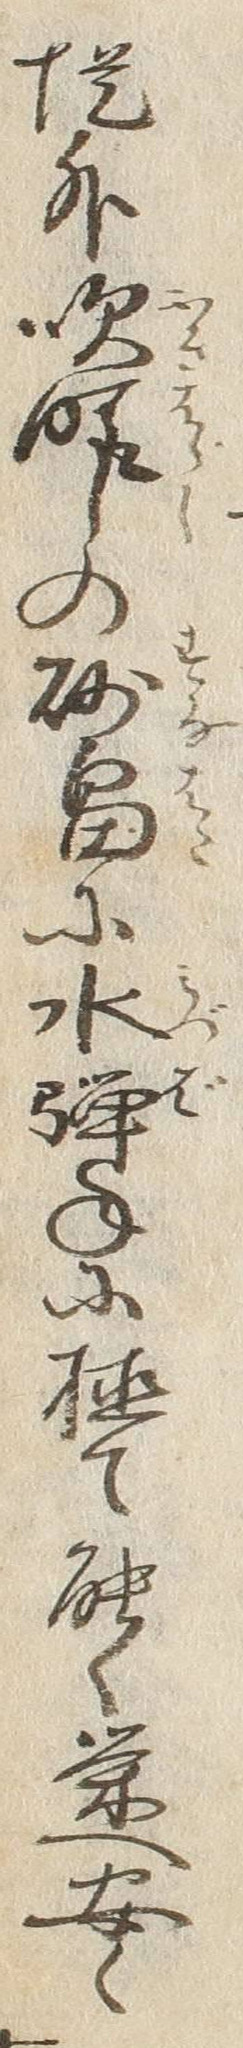堤外吹晴しの砂畠尓水弾年尓植て能く栄へ安く

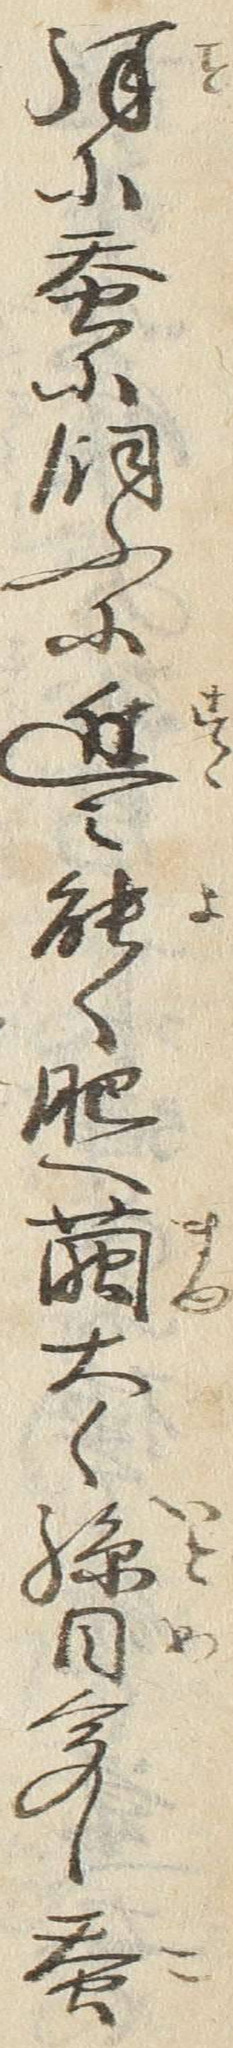殊尓蚕尓飼ふ尓進み能く肥へ繭大く絲目多し蚕
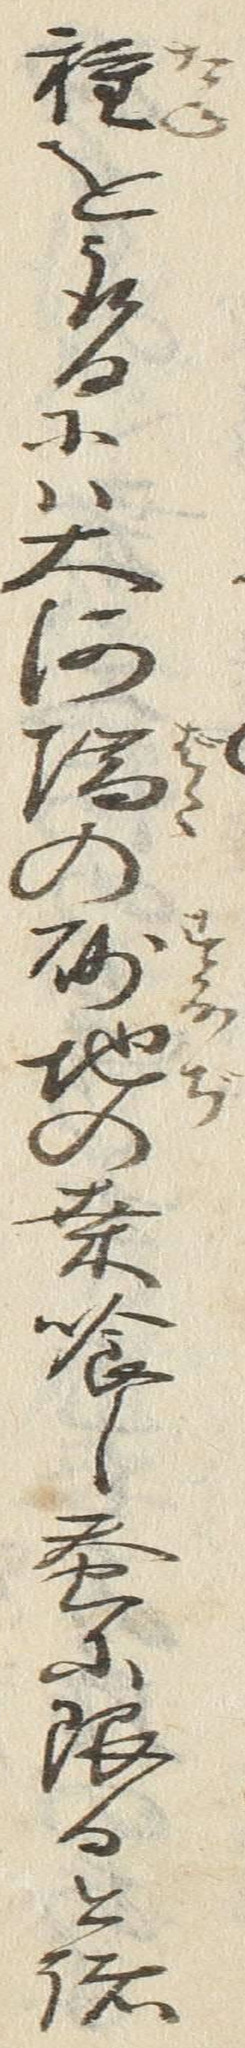種を取る尓は大河端の砂地の桑喰し蚕尓限ると諸
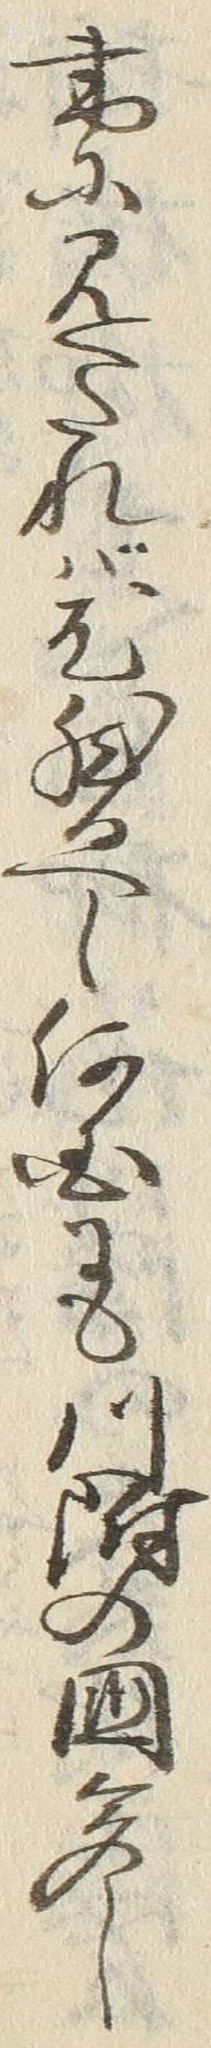書尓見へたれば尤しか然るへし何國尓も川附の國多し
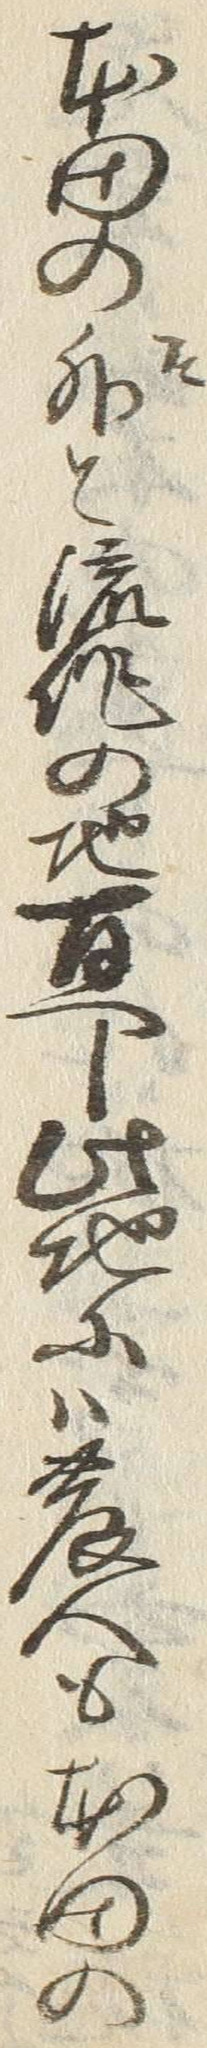本田の外と流作の地有へし此地尓は農人も本田の
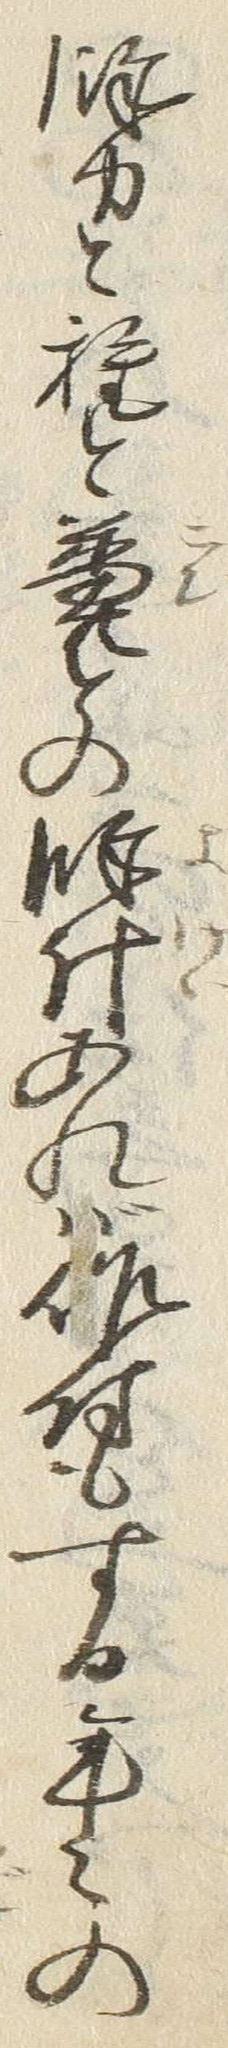餘力と種と糞との餘計あれば作付もする年々の
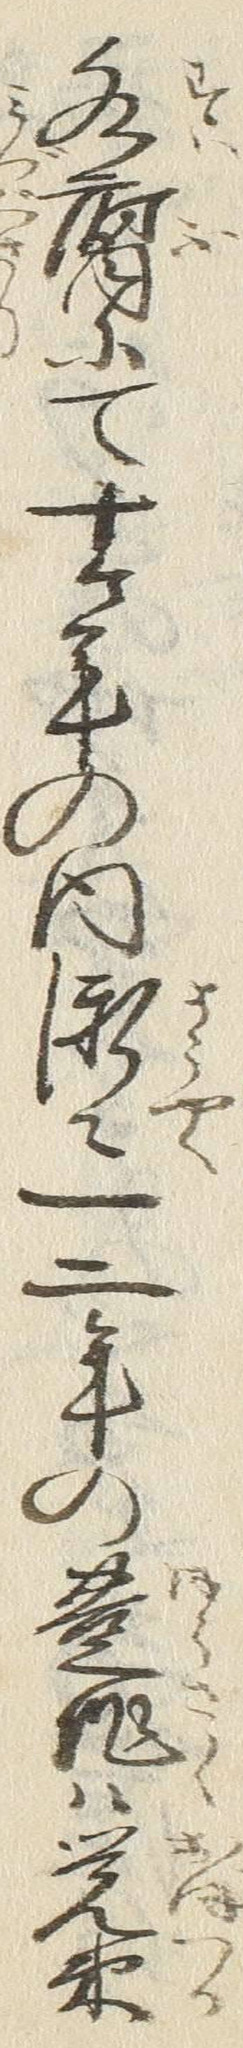水腐尓て十ヶ年の内漸々一二年の豊作は覚束
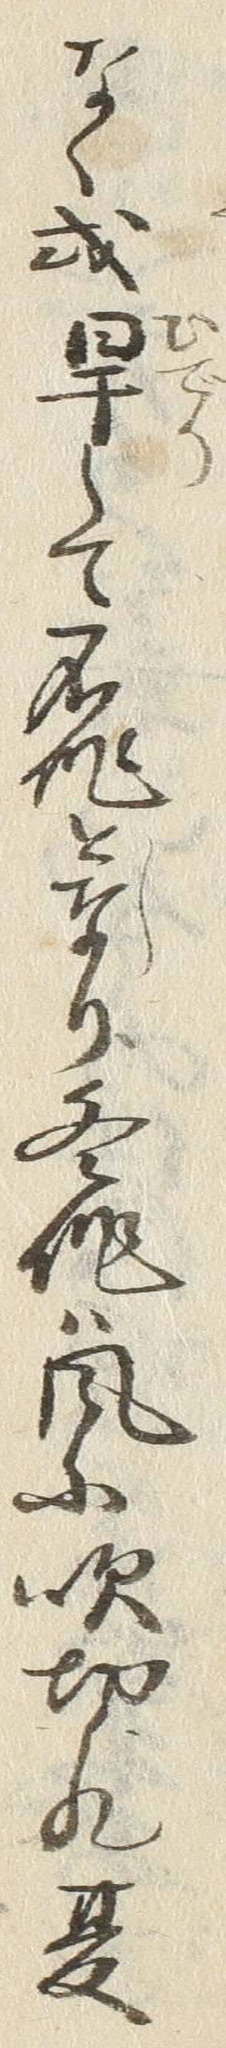なく或旱して不作となり冬作は風尓吹切れ夏
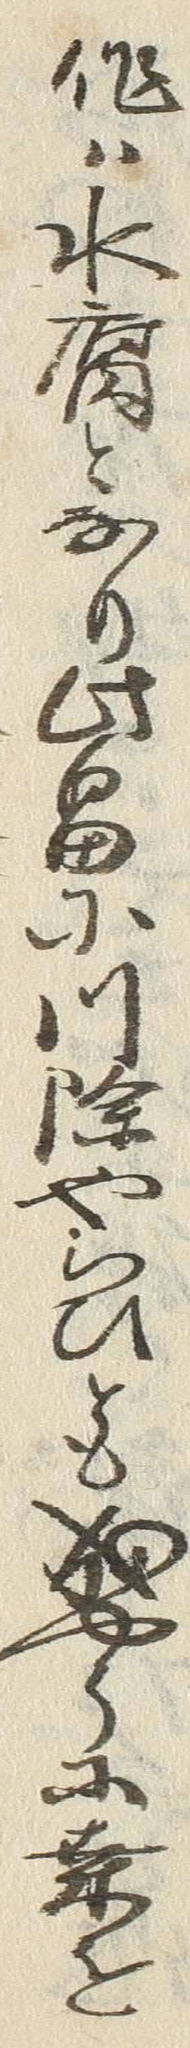作は水腐となり此畠尓川除やらひとも成やう尓桑を
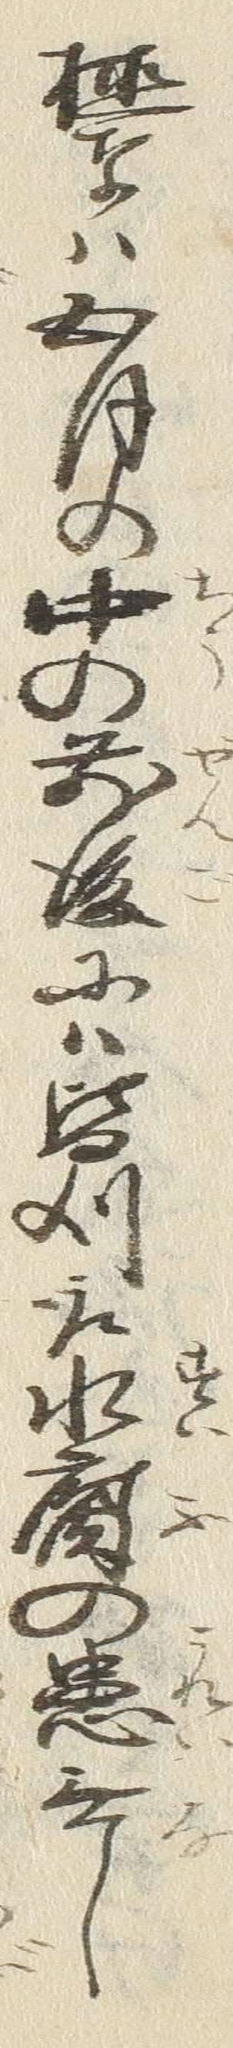植なは五月の中の前後尓は皆刈取水腐の患無し
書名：養蠶實驗録後編
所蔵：東京大学農学生命科学図書館 国文学研究資料館
